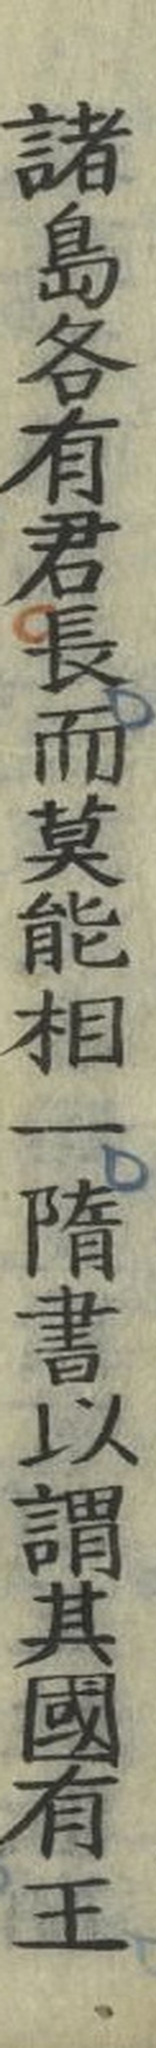諸島各有君長。而莫能相一。隋書以謂其國有王。
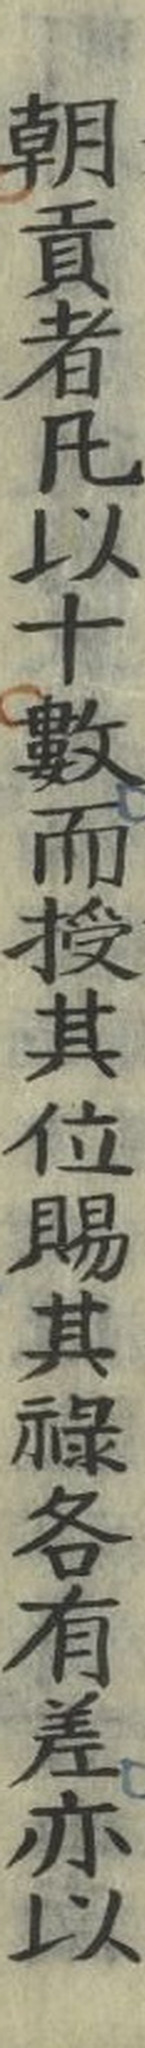朝貢者凡以十數。而授其位賜其祿各有差。亦以
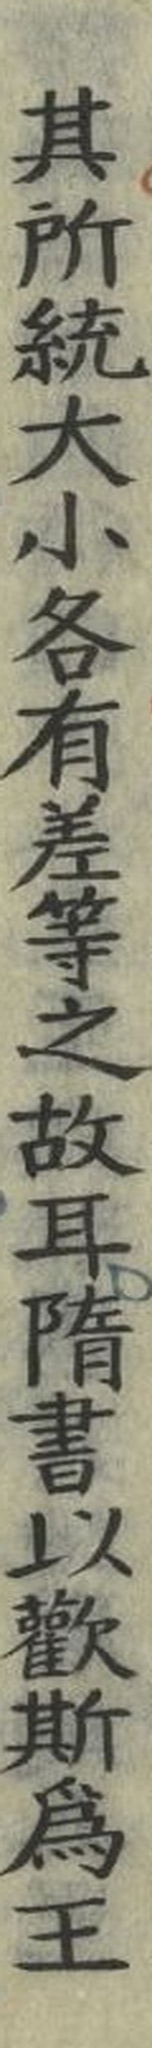其所統大小各有差等之故耳。隋書以歡斯爲王
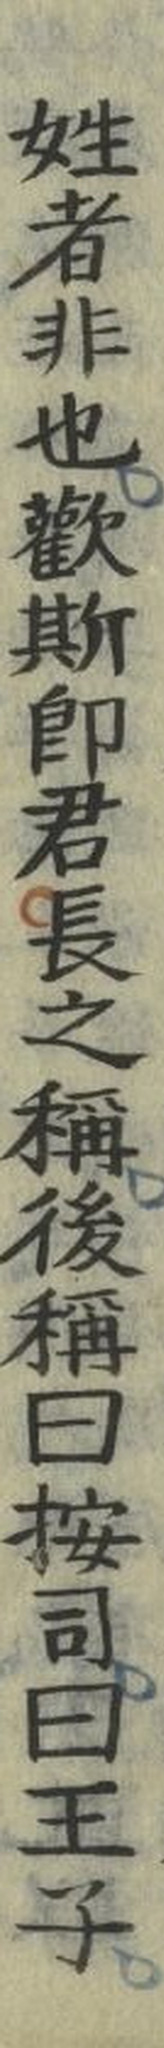姓者非也。歡斯卽君長之稱。後稱曰按司。曰王子。
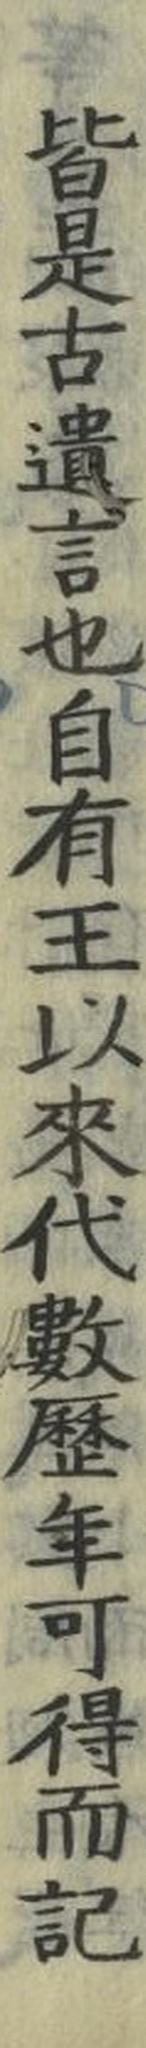皆是古遺言也。自有王以來代數歷年可得而記
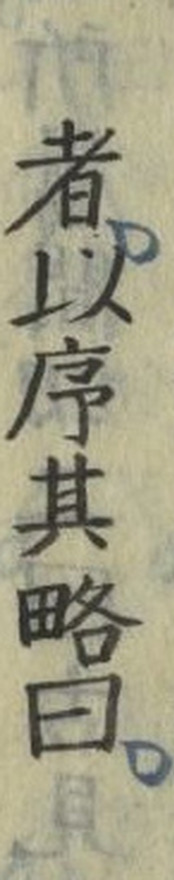者。以序其略曰。
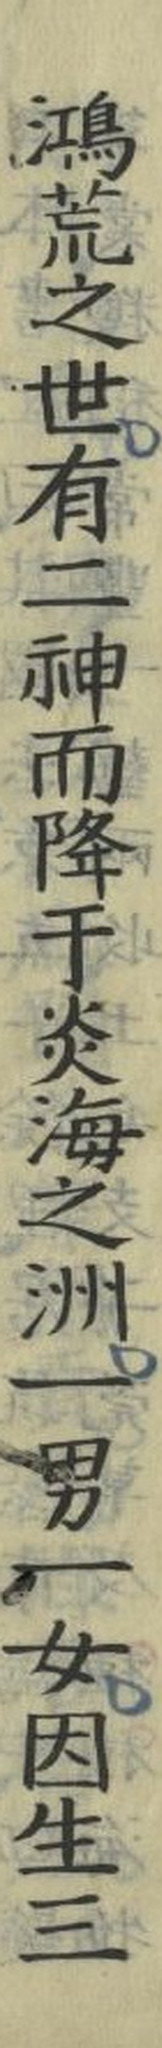鴻荒之世。有二神而降于炎海之洲。一男一女。因生三
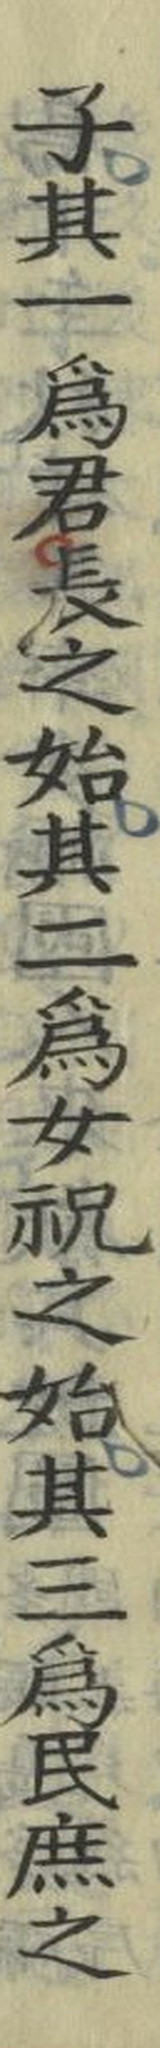子。其一爲君長之始。其二爲女祝之始。其三爲民庶之
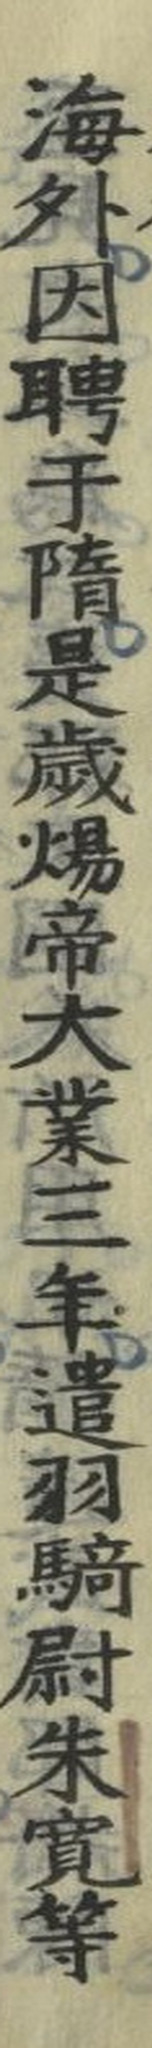海外。因聘于隋。是歲煬帝大業三年。遣羽騎尉朱寛等
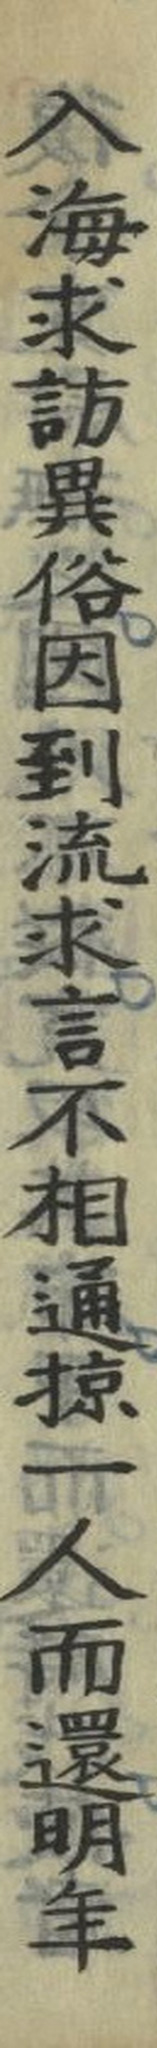入海求訪異俗。因到流求。言不相通。掠一人而還。明年

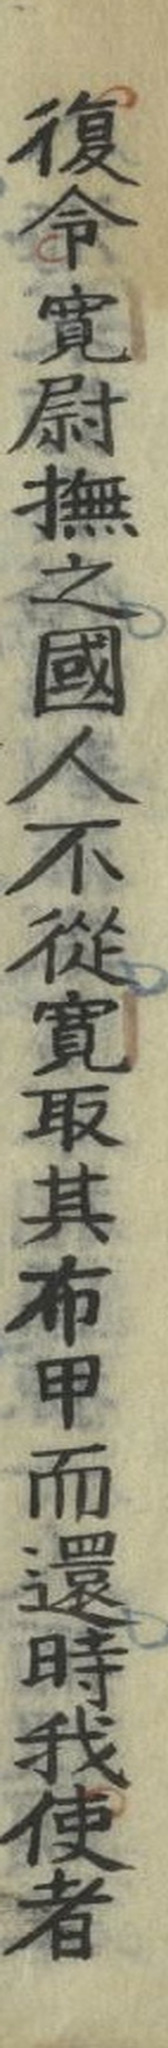復令寛尉撫之。國人不從。寛取其布甲而還。時我使者
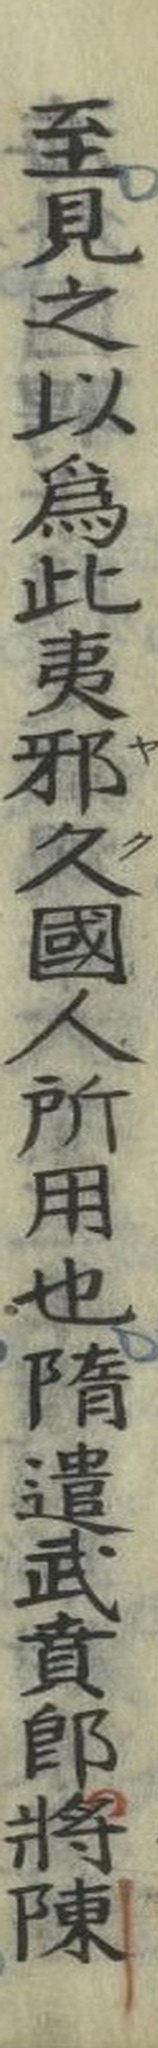至。見之以爲此夷邪久國人所用也。隋遣武賁郎將陳
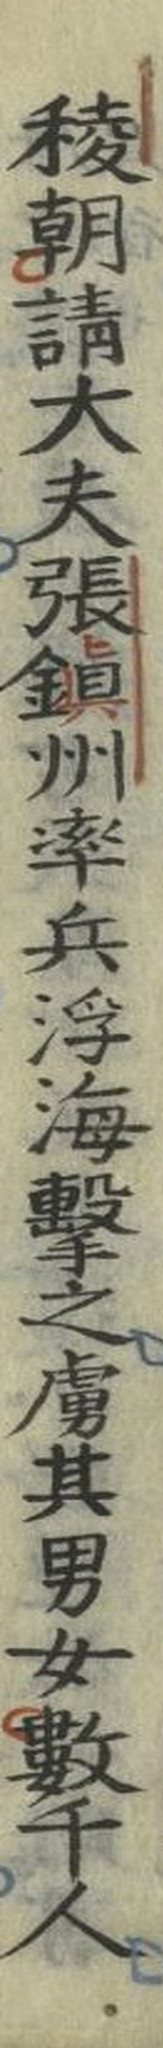稜朝請大夫張鉬鎭州率兵浮海擊之。虜其男女數千人。
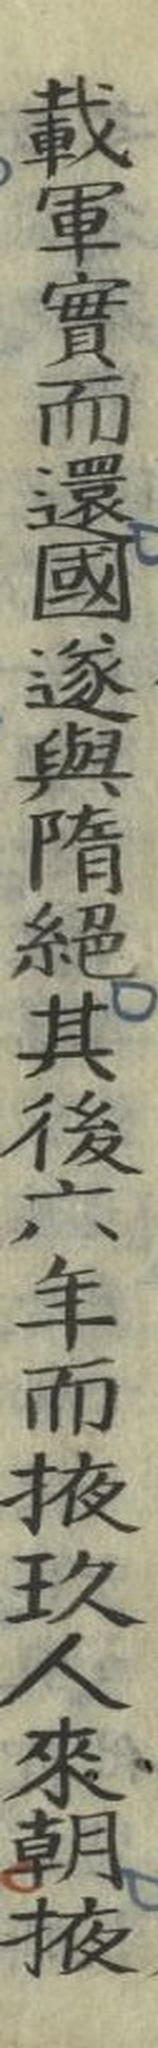載軍實而還。國遂與隋絕。其後六年而掖玖人來朝。掖
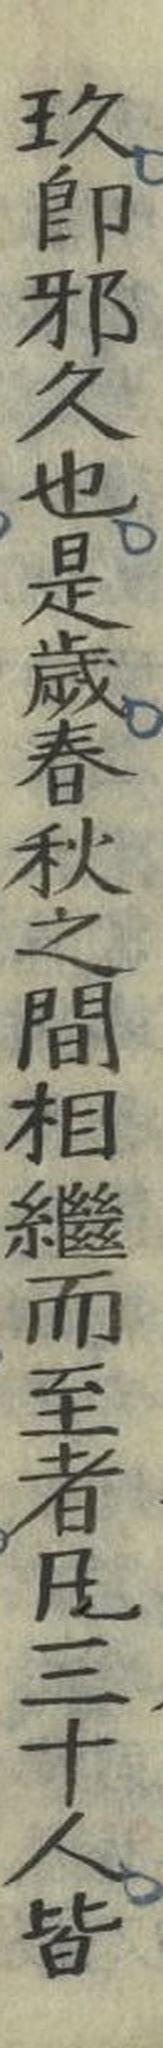玖。卽邪久也。是歲。春秋之間相繼而至者凡三十人。皆
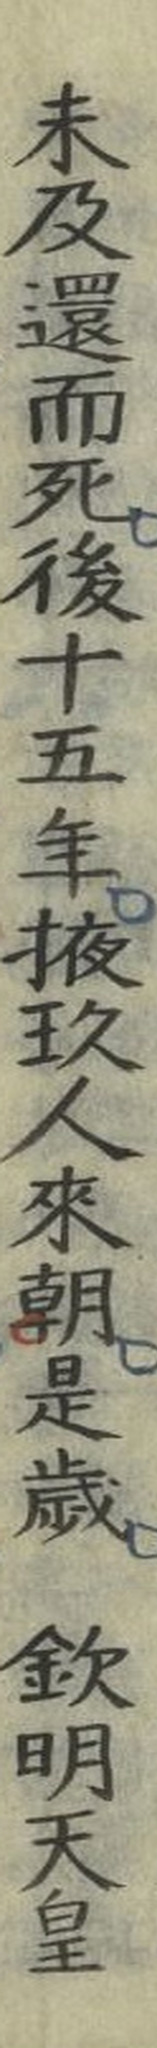未及還而死。後十五年。掖玖人來朝。是歲。欽明天皇
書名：南島志
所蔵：University of the Ryukyus Library
